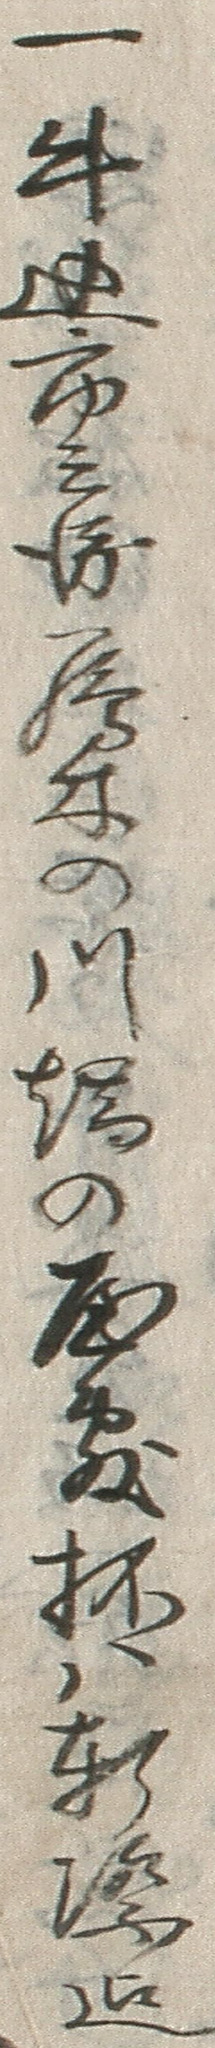一牛込市兵衛雁木の川端の屋敷抔は軒際迄
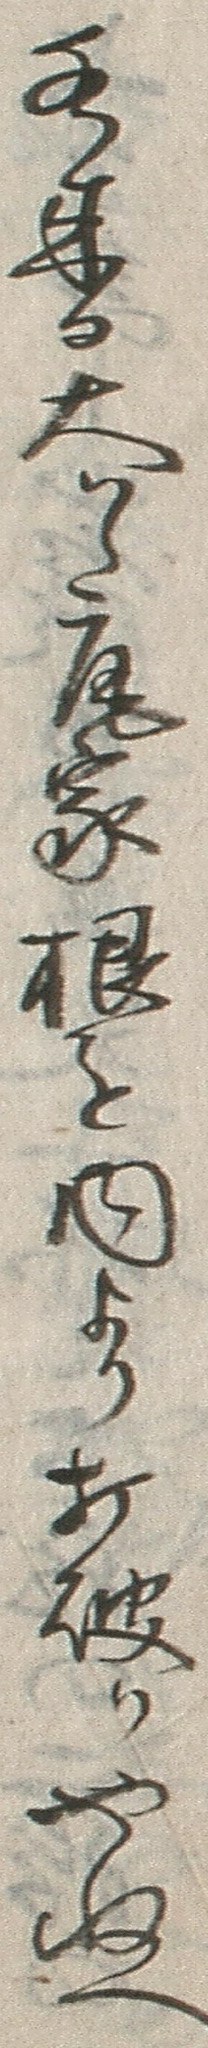水来る大かた瓦家根を内より打破りやねへ

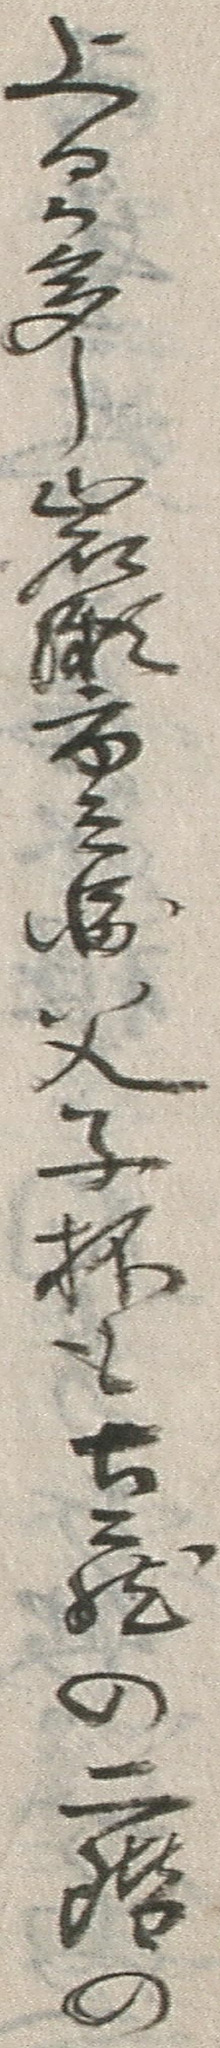上るか多し岩瀬市兵衛父子抔も土蔵の二階の
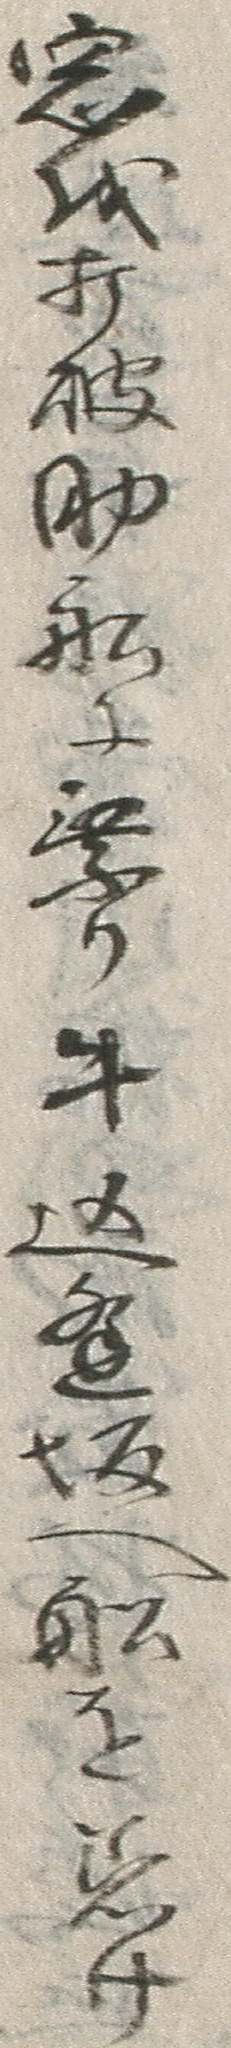窓を打破助船に乗り牛込逢坂へ船を着け
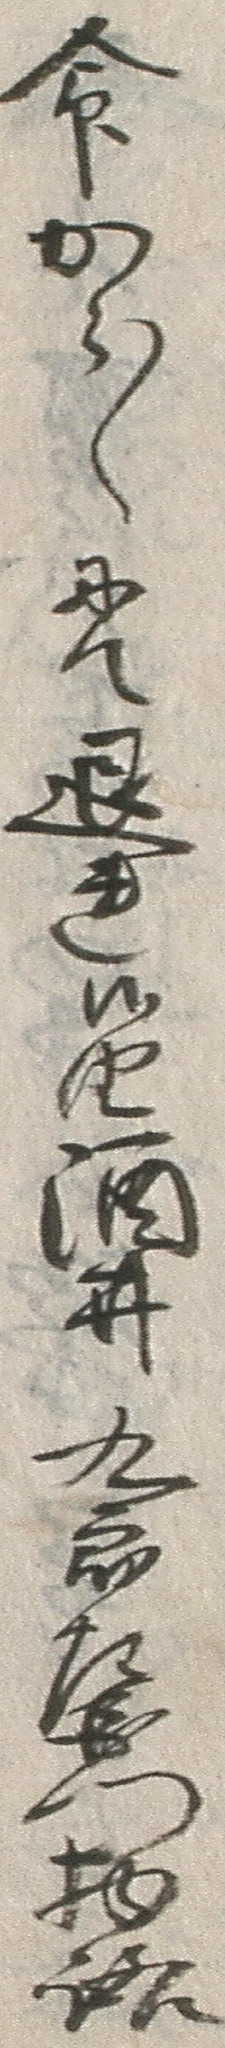命から〳〵にて退れ候由酒井九郎左衛門物語
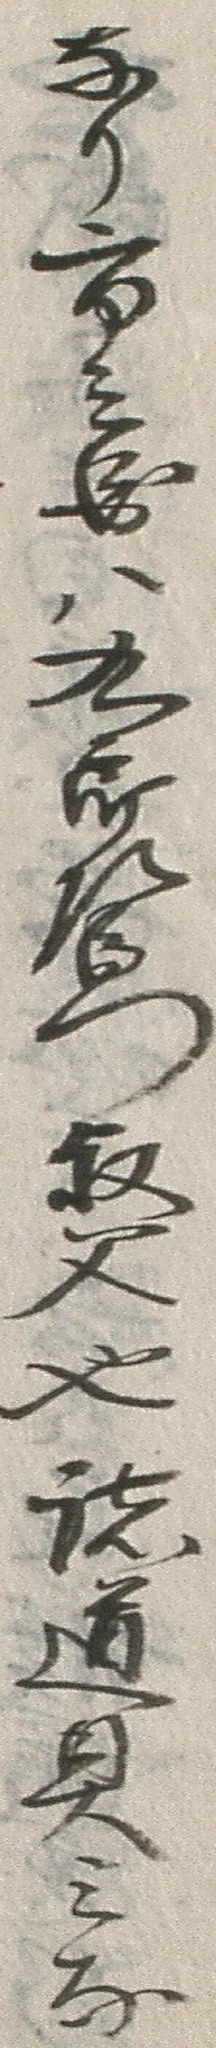なり市兵衛は九郎左衛門叔父也諸道具みな
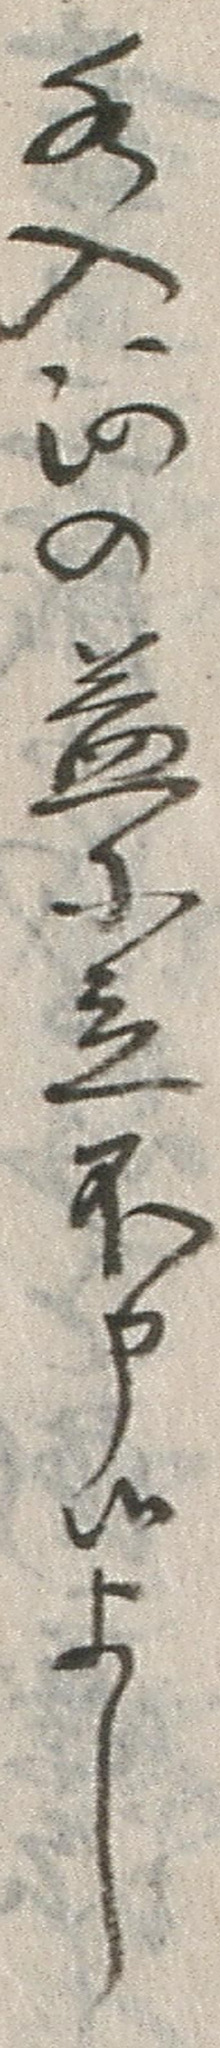水入河の益に立不申候よし
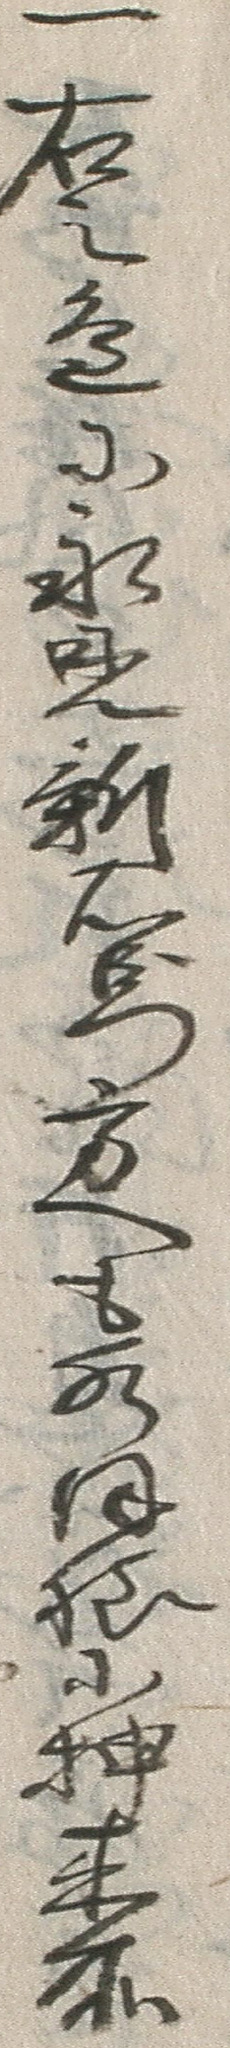一右之辺に永見新右衛門方へも水同様に押来所
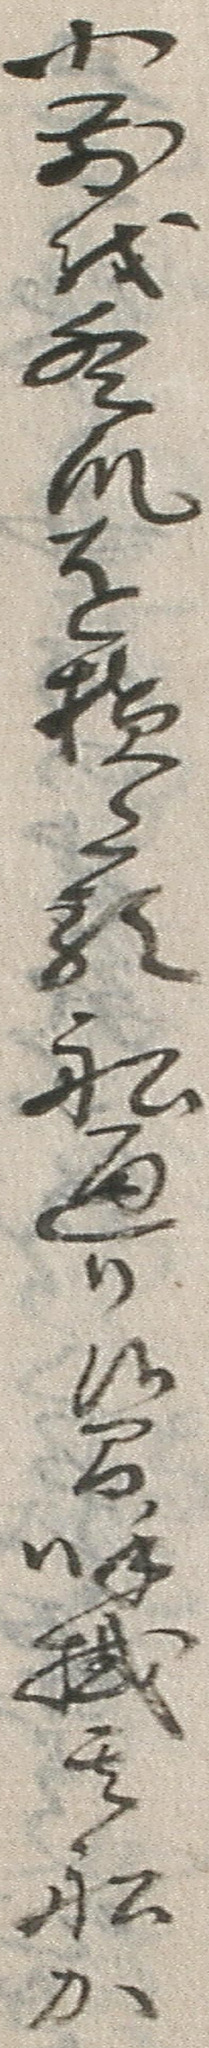に前を冬瓜を積たる船通り候間呼掛其船か
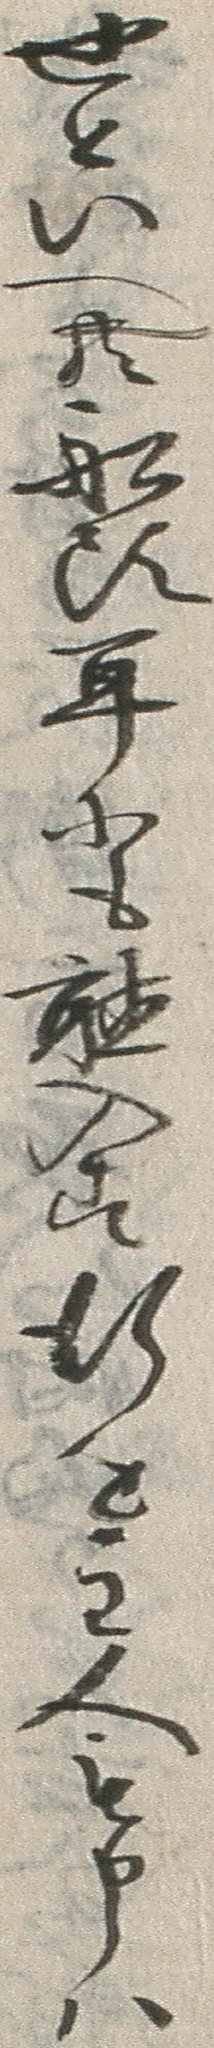せといへ共船頭耳にも聴入す行を主人も申は
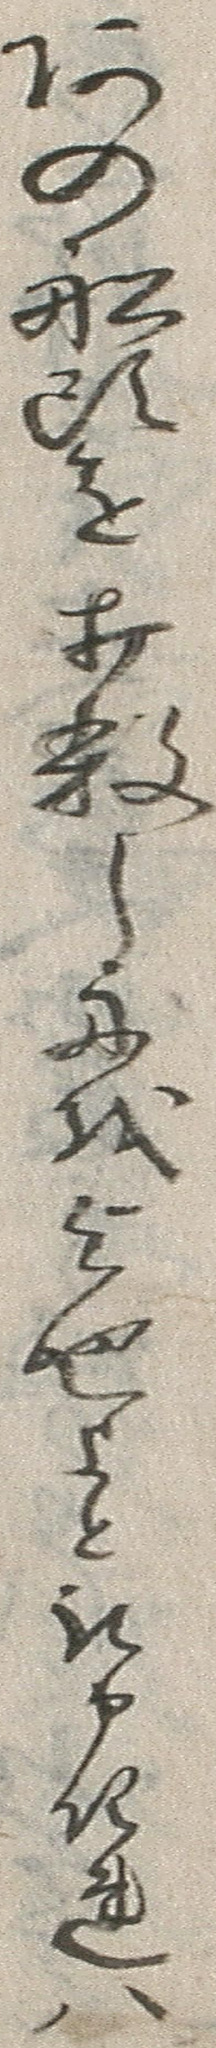あの船頭を打殺し舟をよせよと被申されは
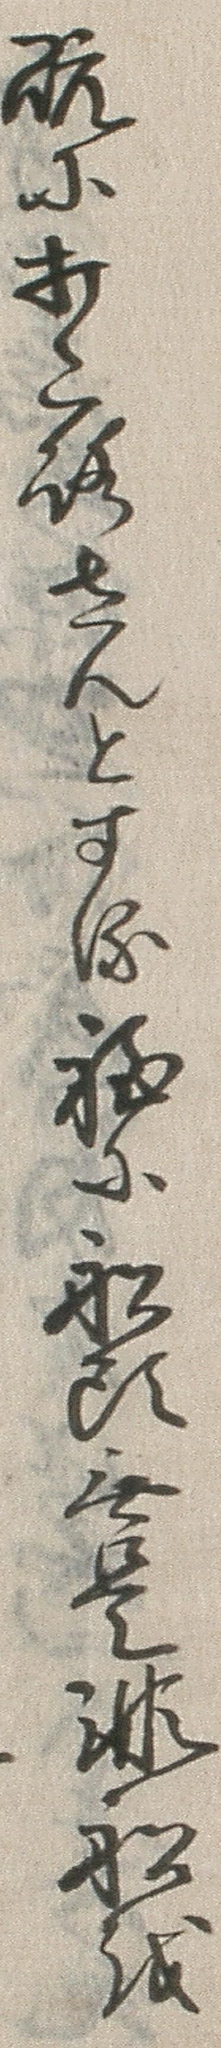既に打ころさんとする程に船頭無是非船を
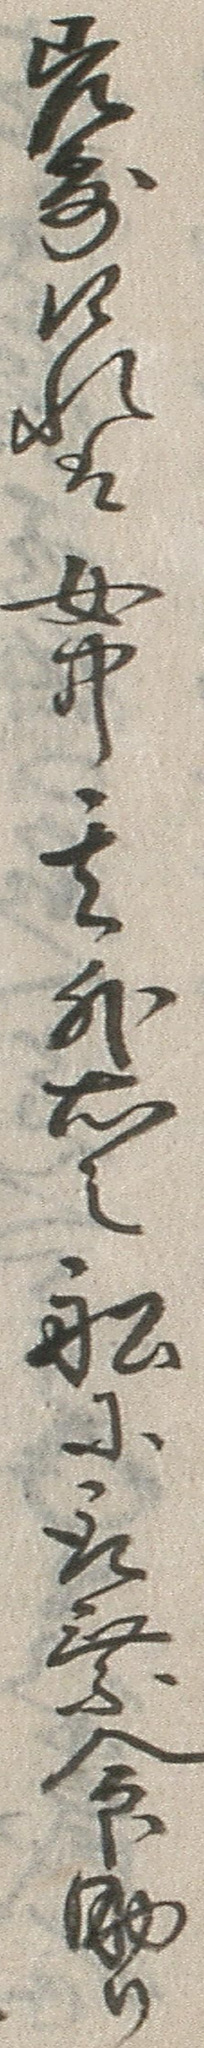差寄けれは女中其外右之船に取乗命助り
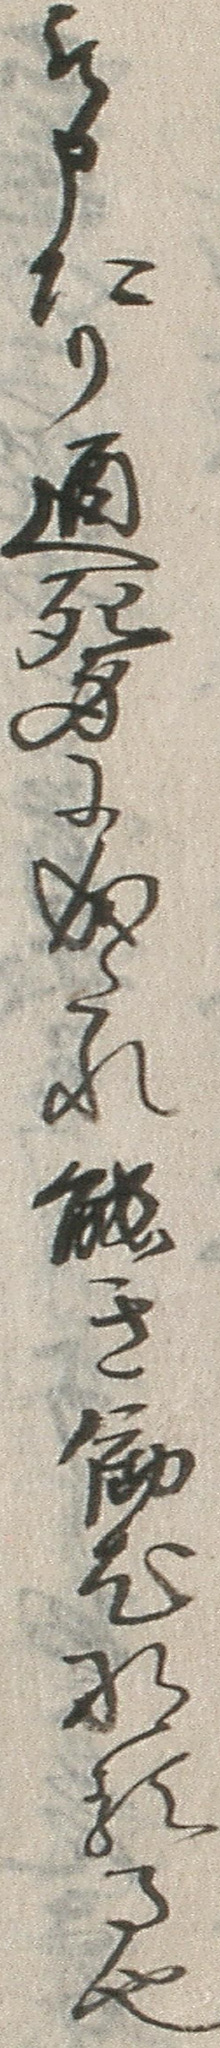被申たり通死身に成たれ能き働尤なる事也
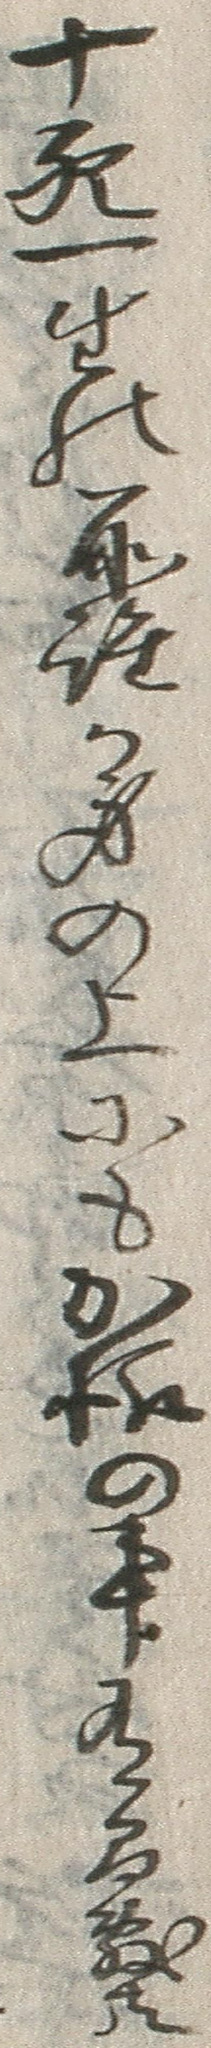十死一生の所誰か身の上にもか様の事有間敷共
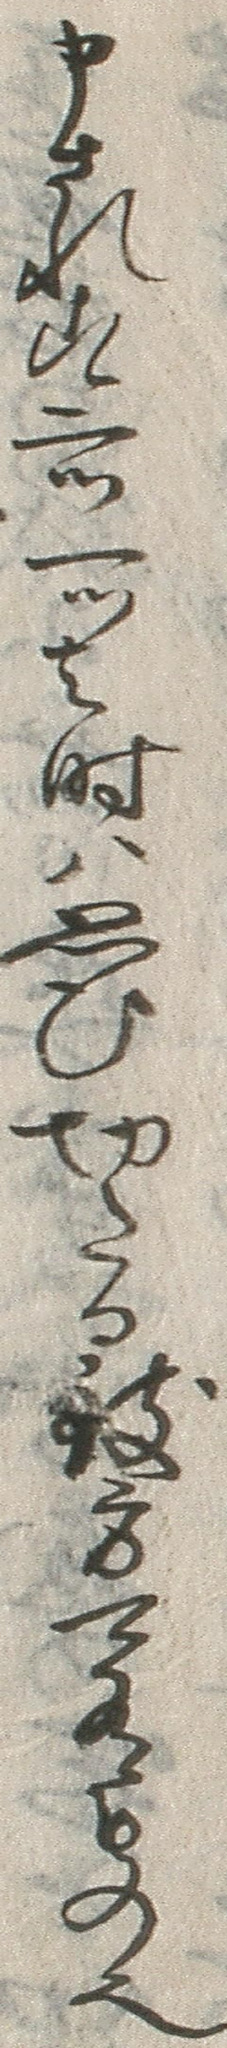申されす二ツ一ツは時は思ひ切たる致方可有もの也
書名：享保十三年江戸洪水記
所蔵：東京大学地震研究所図書室 Earthquake Research Institute Library, The University of Tokyo, JAPAN
